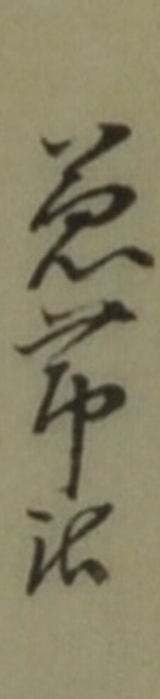兼帯被
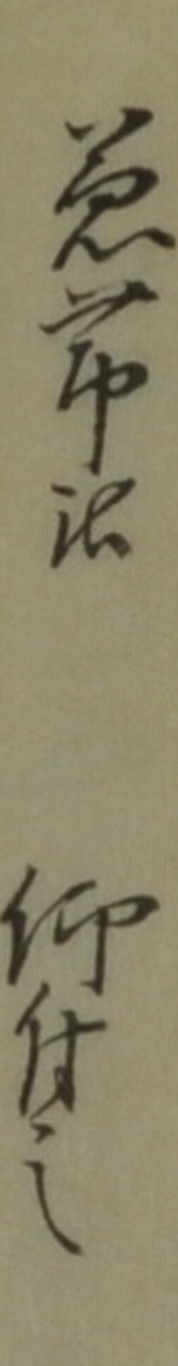兼帯被仰付之
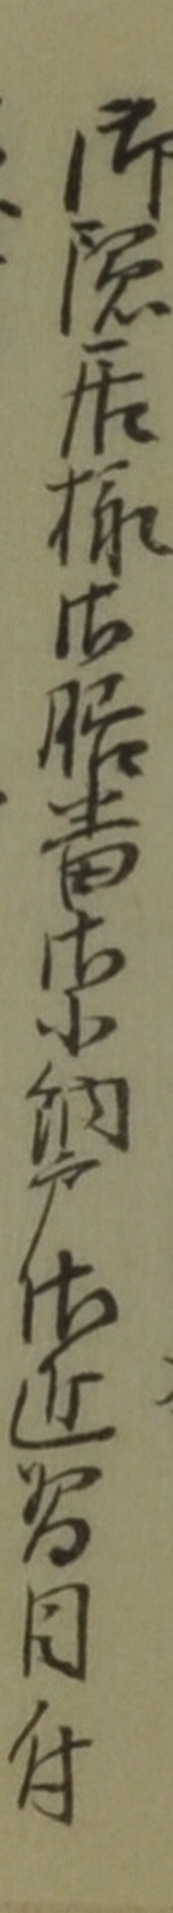御隠居様御膳番御小納戸御近習目付
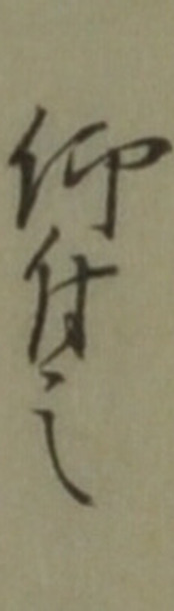仰付之
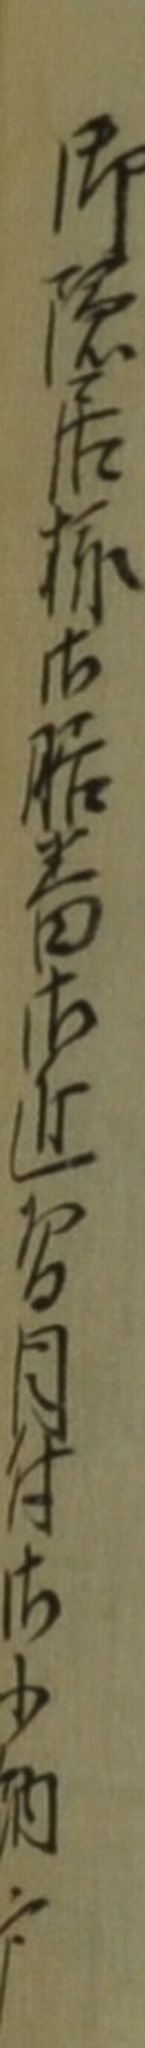御隠居様御膳番御近習目付御小納戸
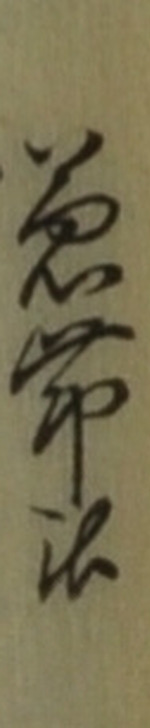兼帯被
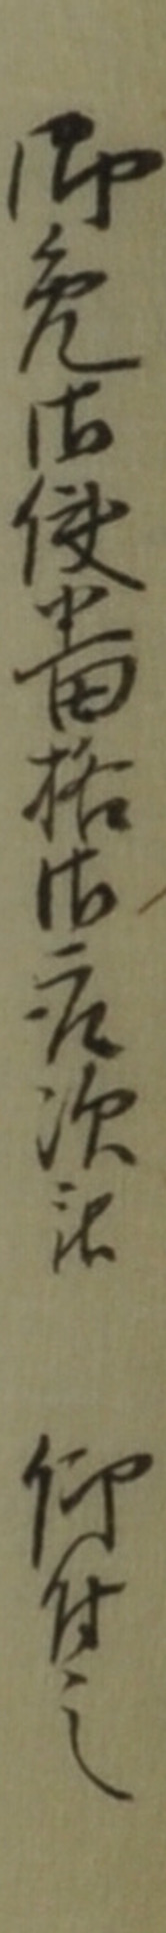御免御使番格御取次被仰付之
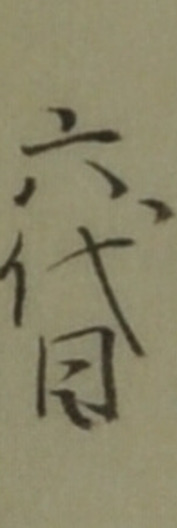六代目
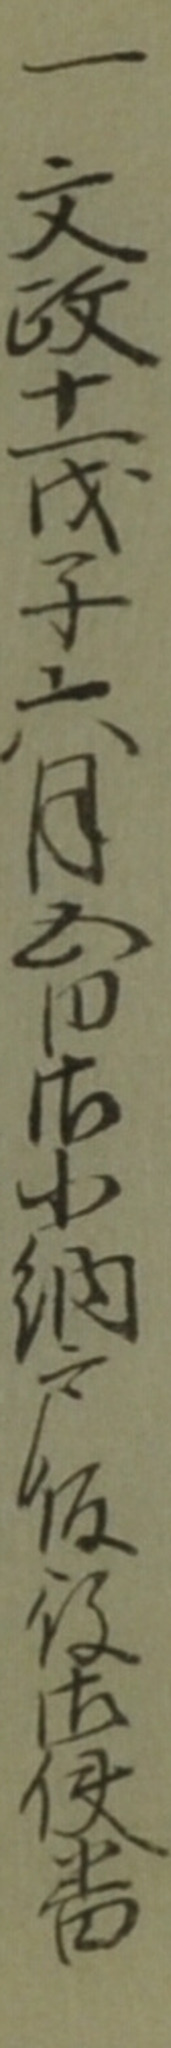一文政十一戊子六月五日御小納戸仮役御使番
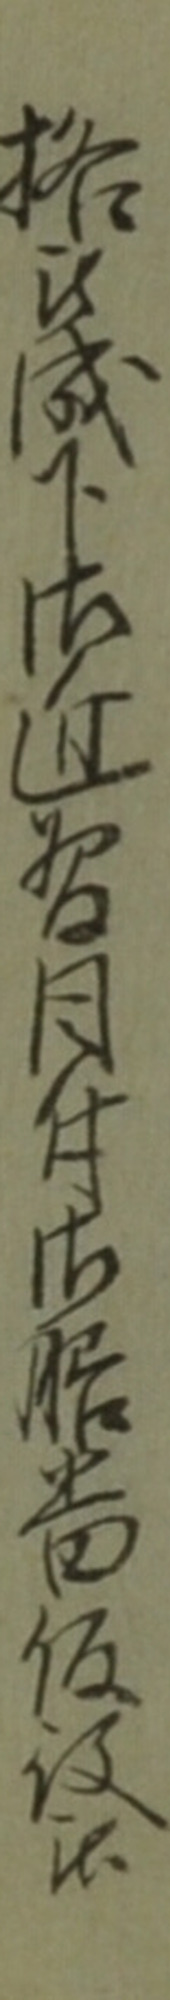格被成下御近習目付御膳番仮役被
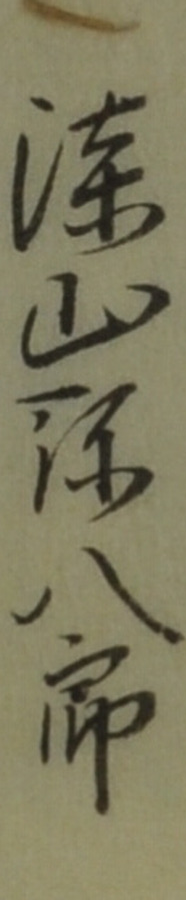漆山孫八郎
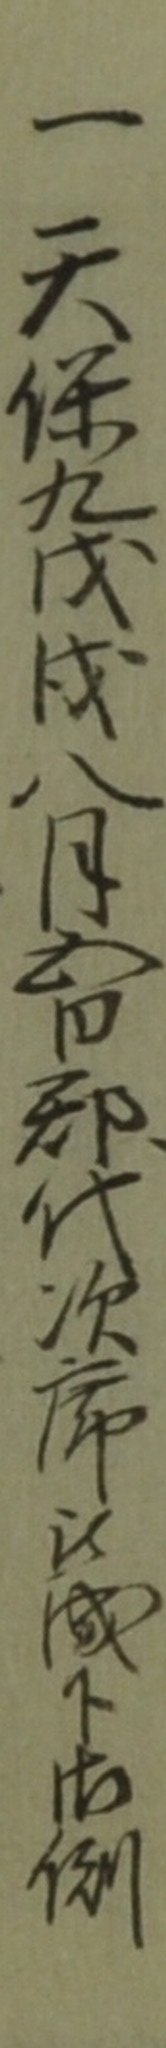一天保九戊戌八月五日郡代次席被成下御側
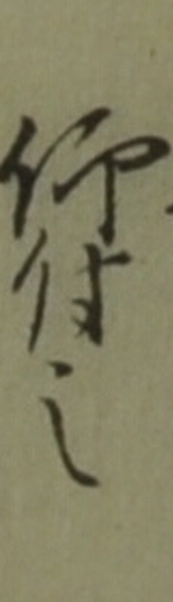仰付之
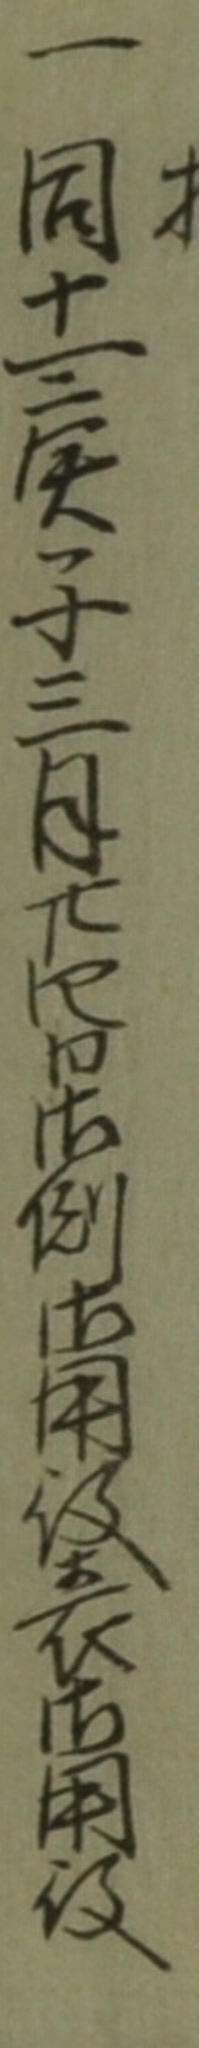一同十一庚子三月廿四日御側御用役表御用役
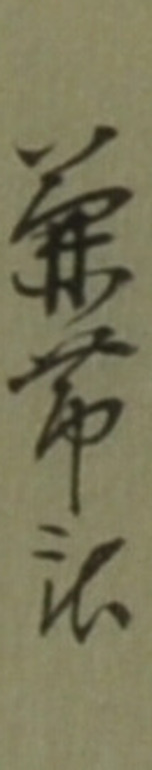兼帯被
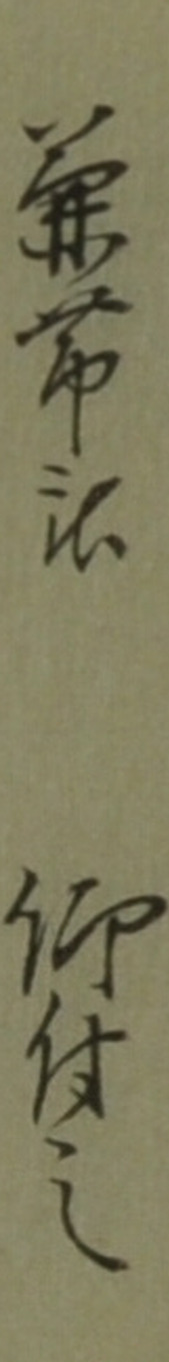兼帯被仰付之
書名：諸御役代々録（四）
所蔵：伊那市立高遠町図書館・合同会社AMANE
